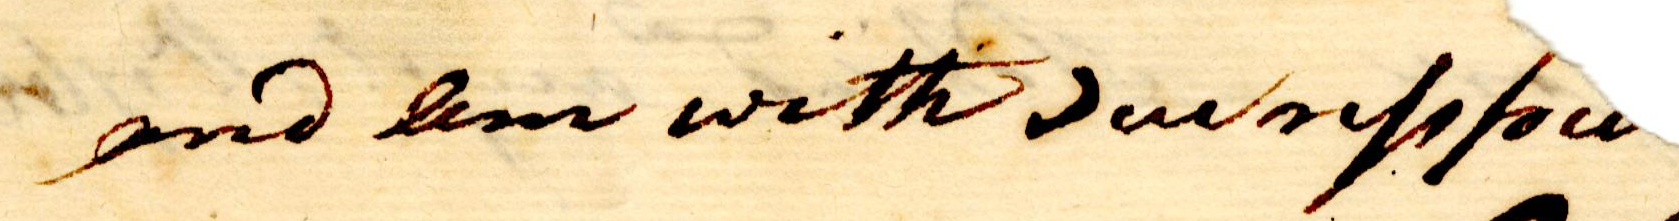and am with due resspec
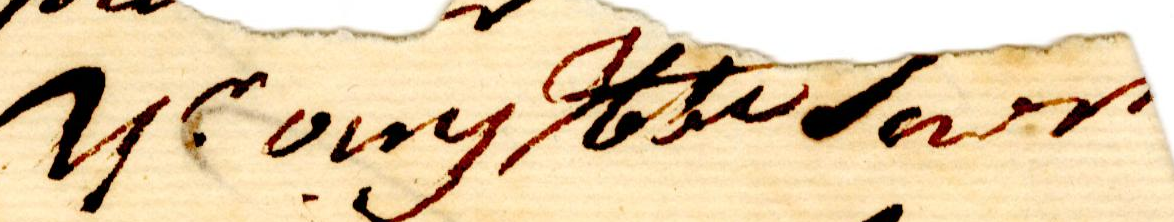y^r. very Hbe Serv
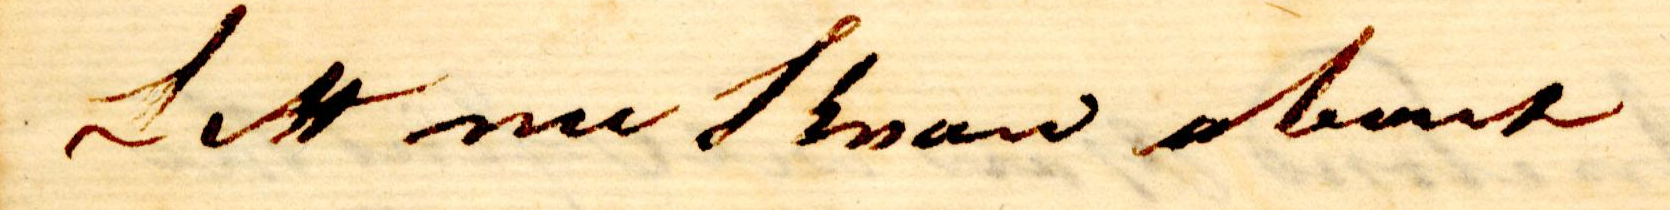Lett me know about
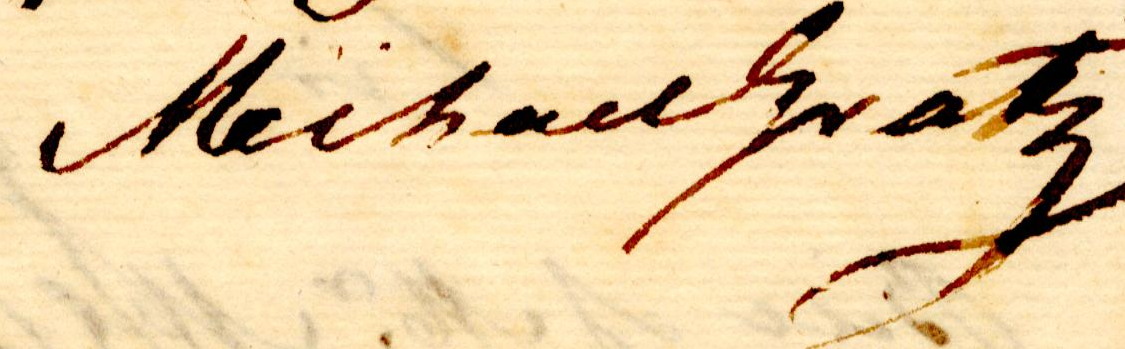Michael Gratz
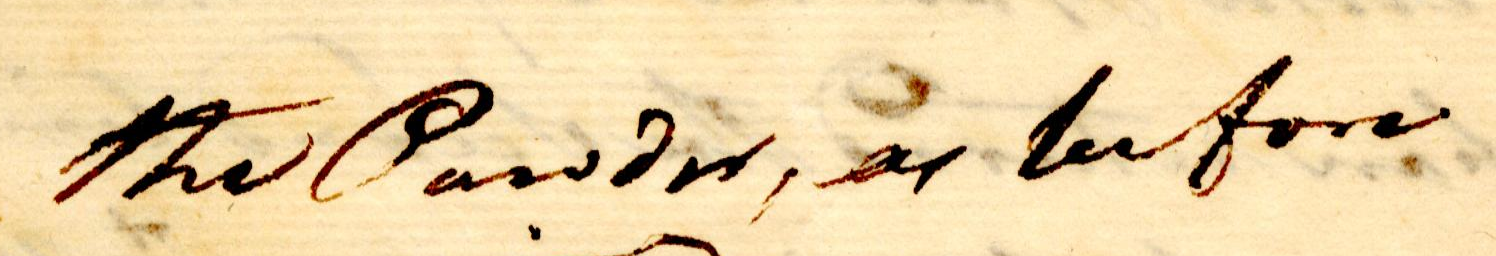the Powder, as before
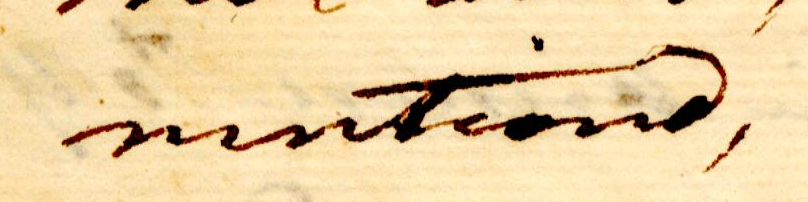Mentioned
